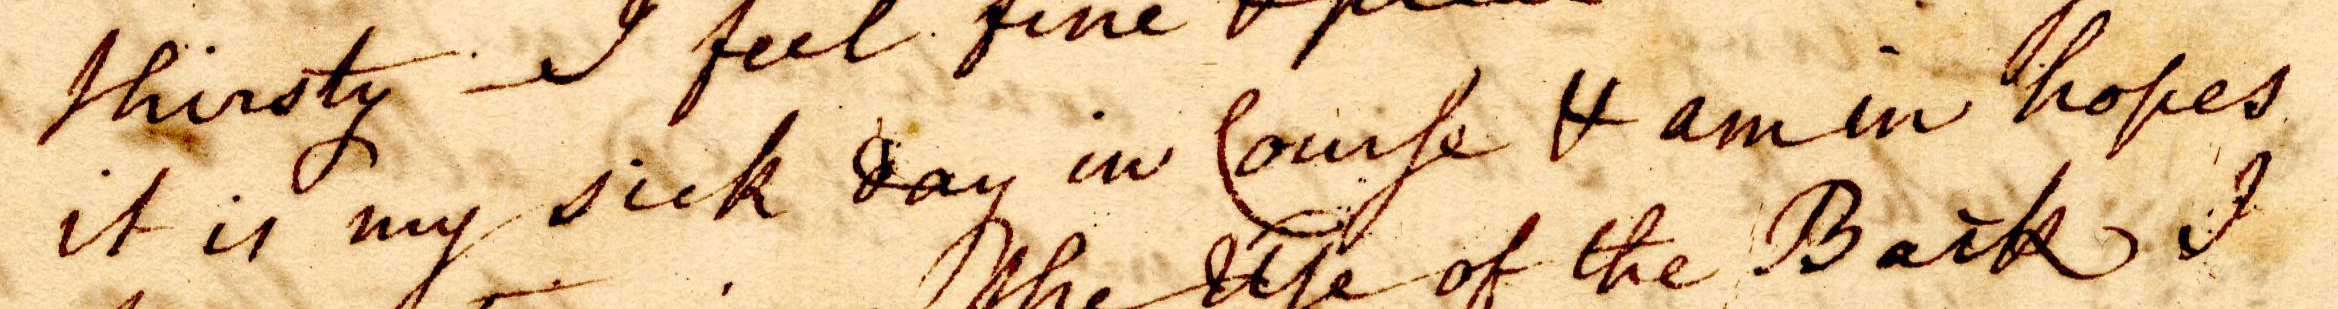it is my sick day in Course & am in hopes
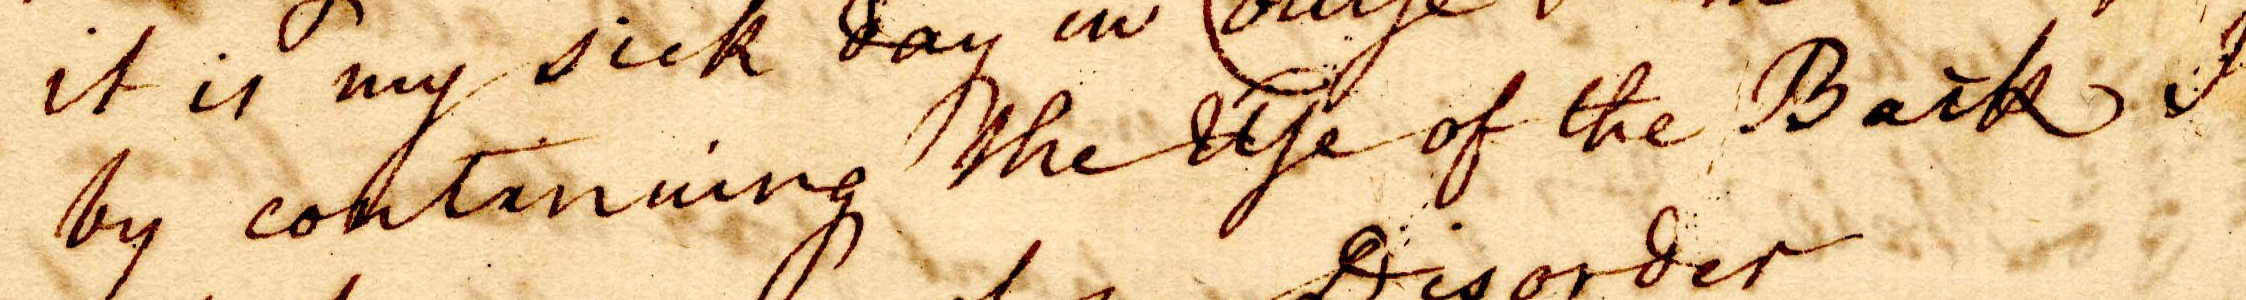by continuing the Use of the Bark I
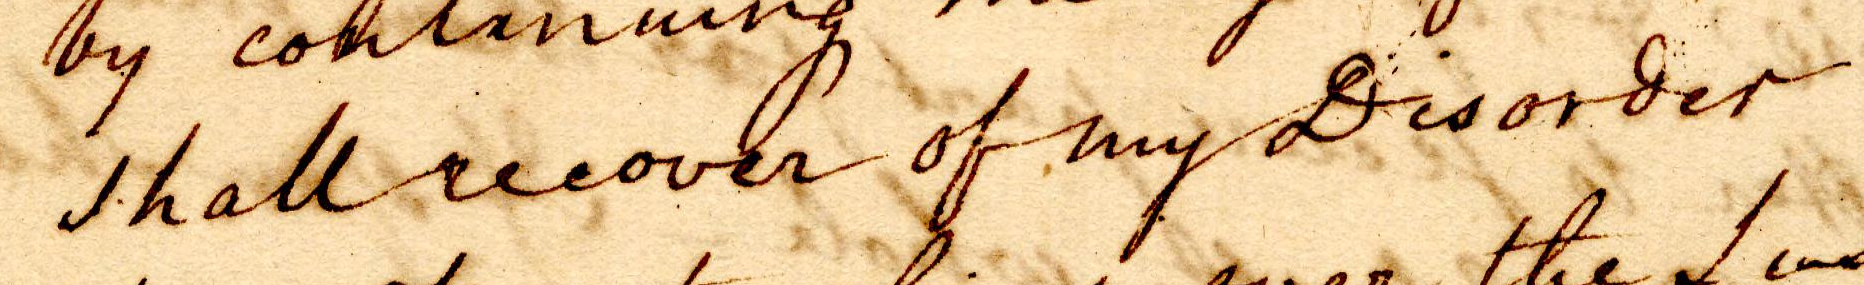shall recover of my Disorder
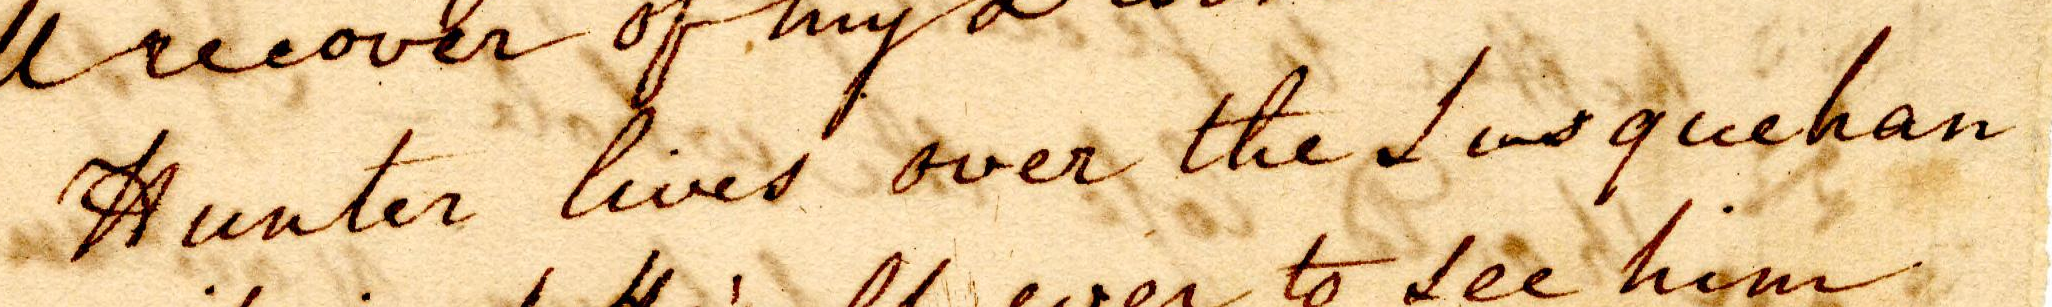Hunter lives over the Susquehan
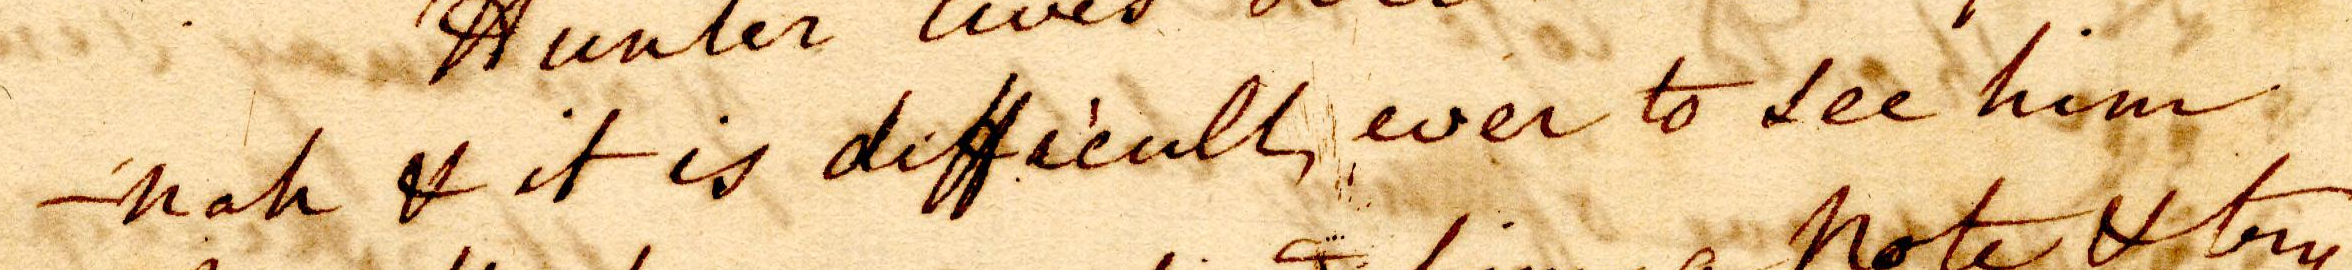-nah & it is difficult ever to see him
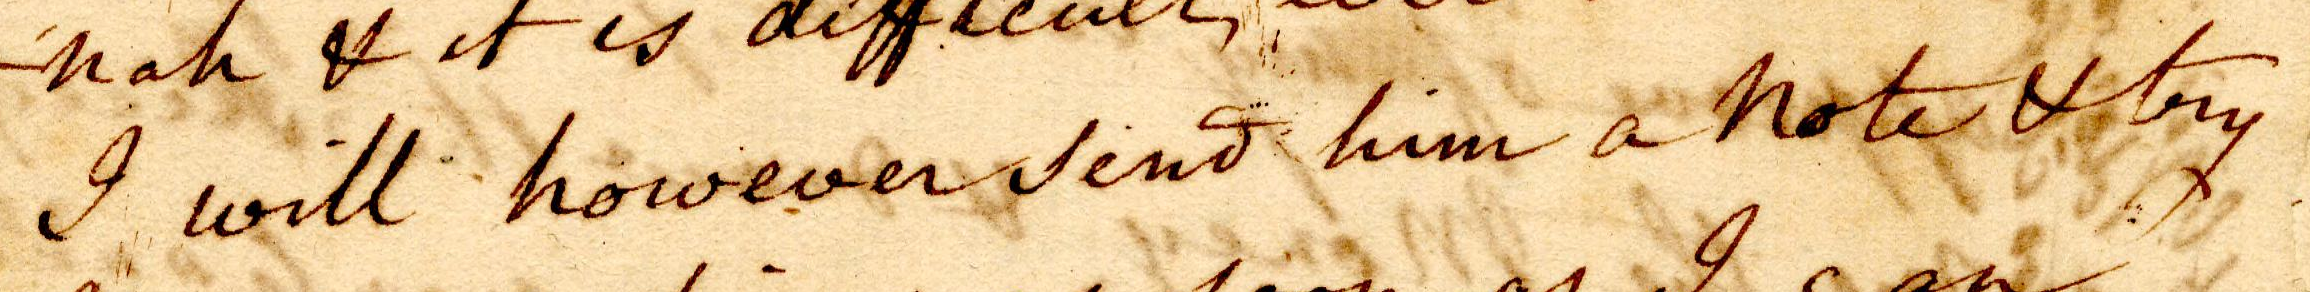I will however send him a note & beg
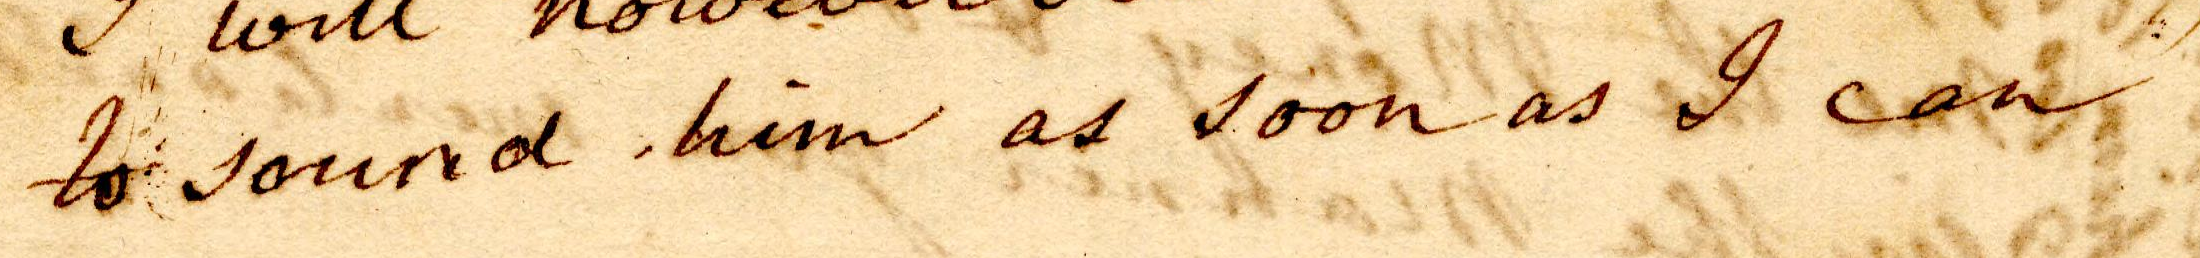to sound him as soon as I can
